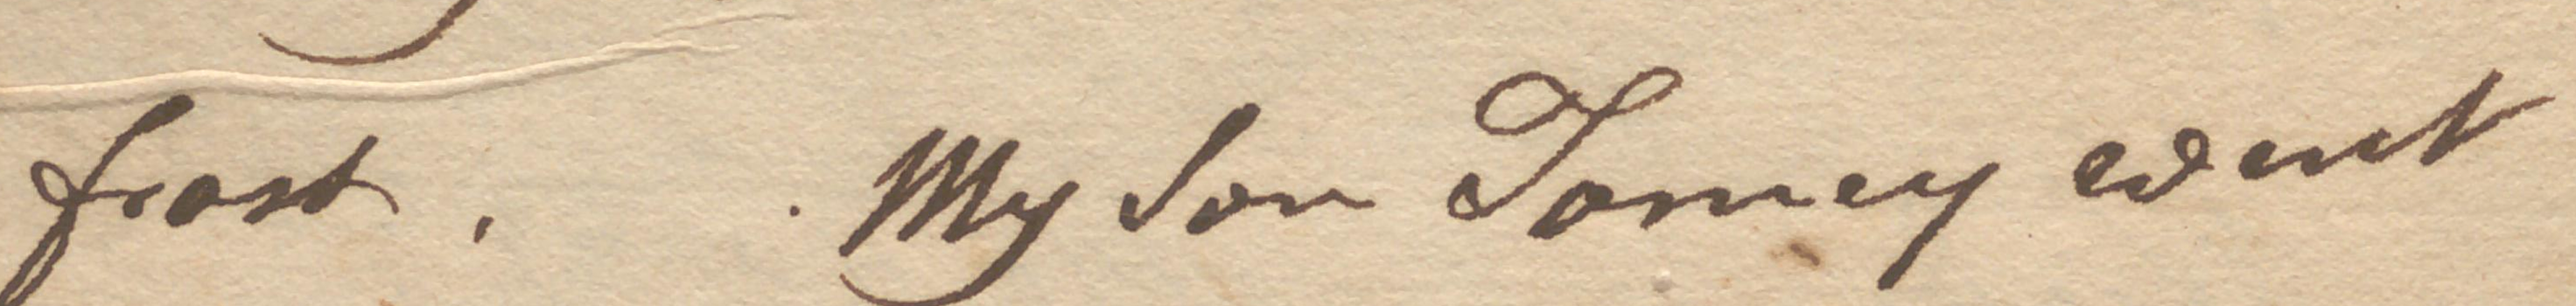frost. My Son Tomey went
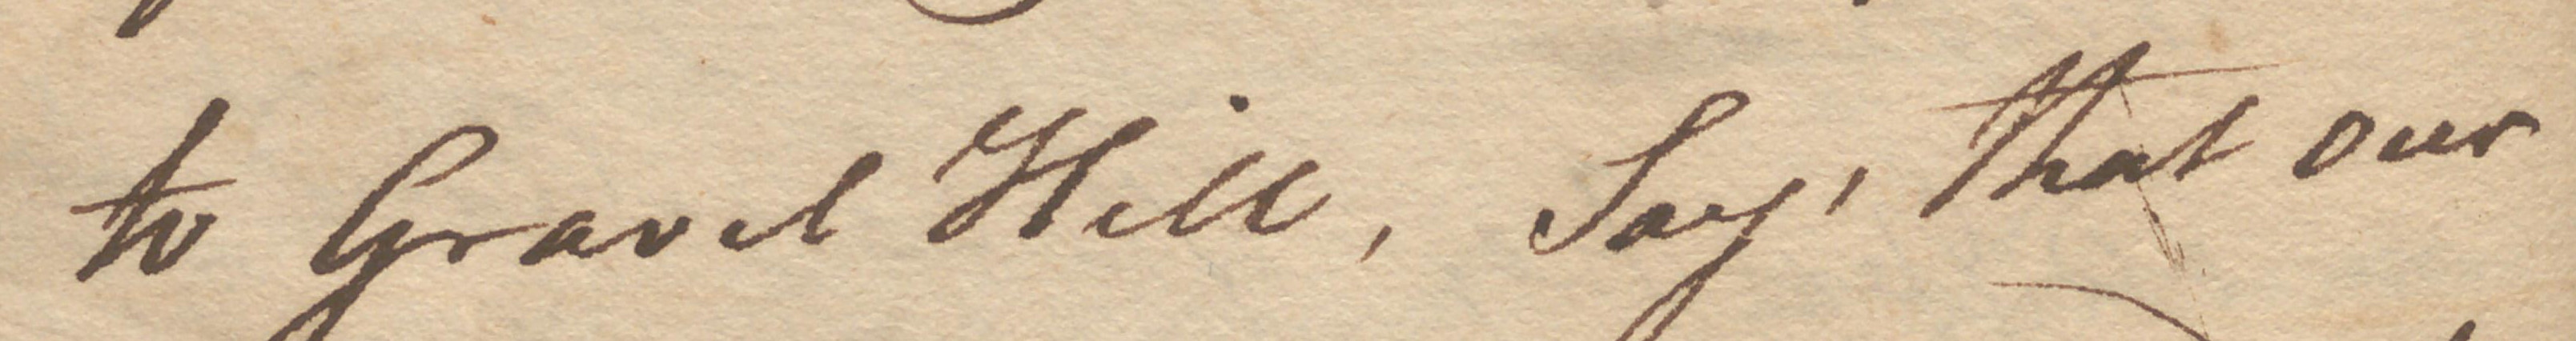to Gravel Hill, Says that our
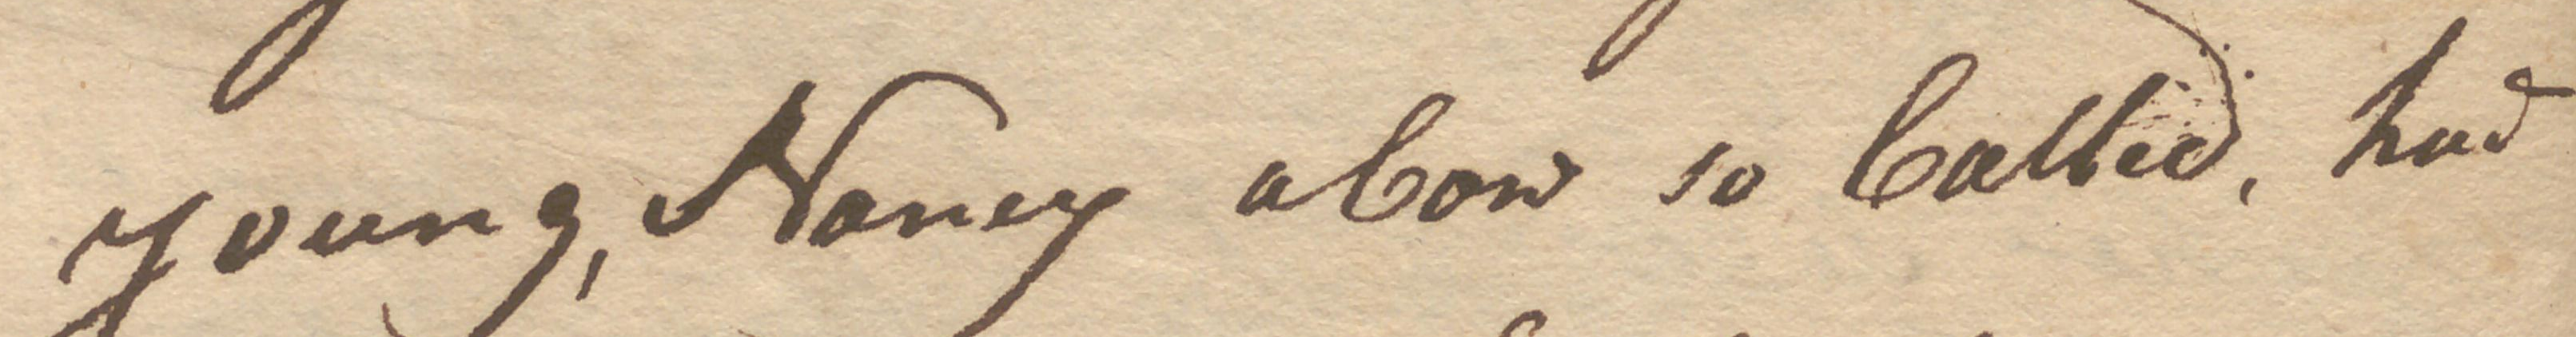young Naney a Cow so Called, had
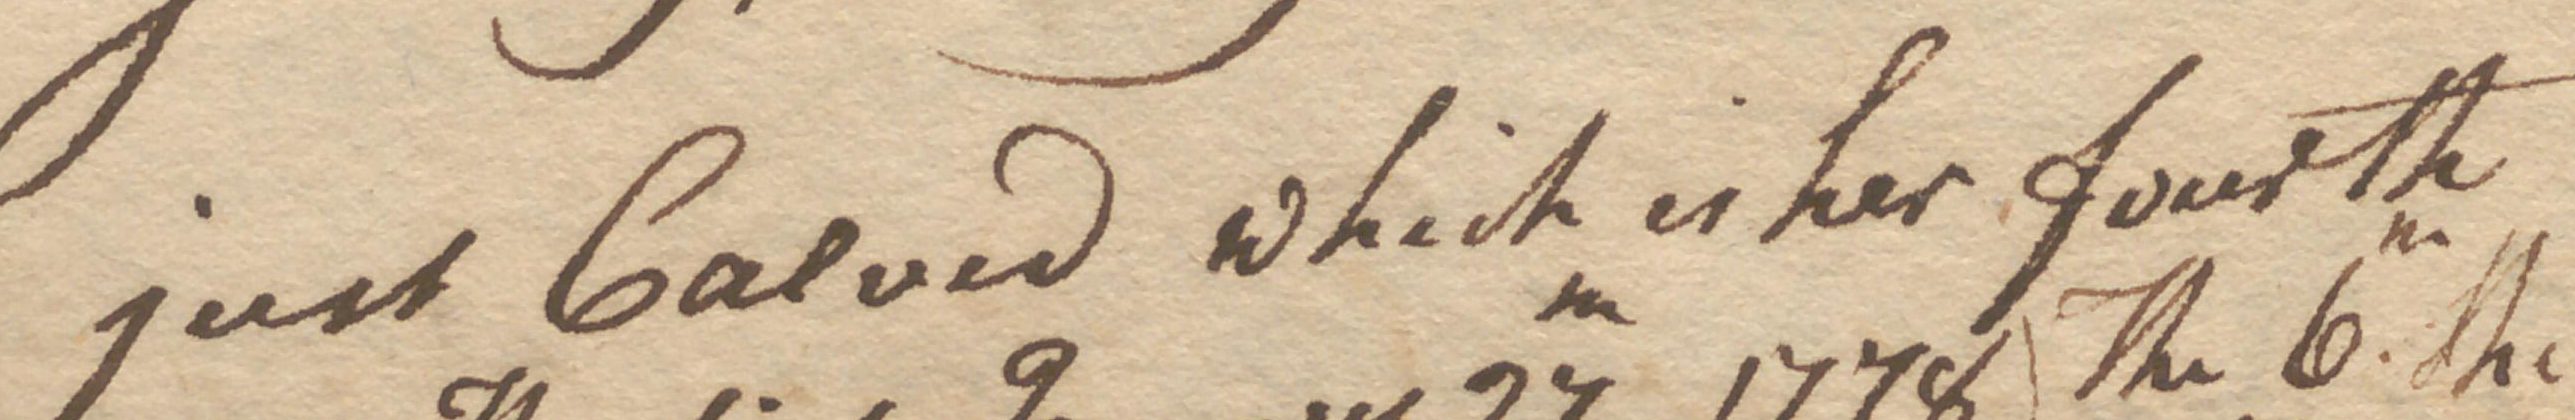just Calved which is her fourth
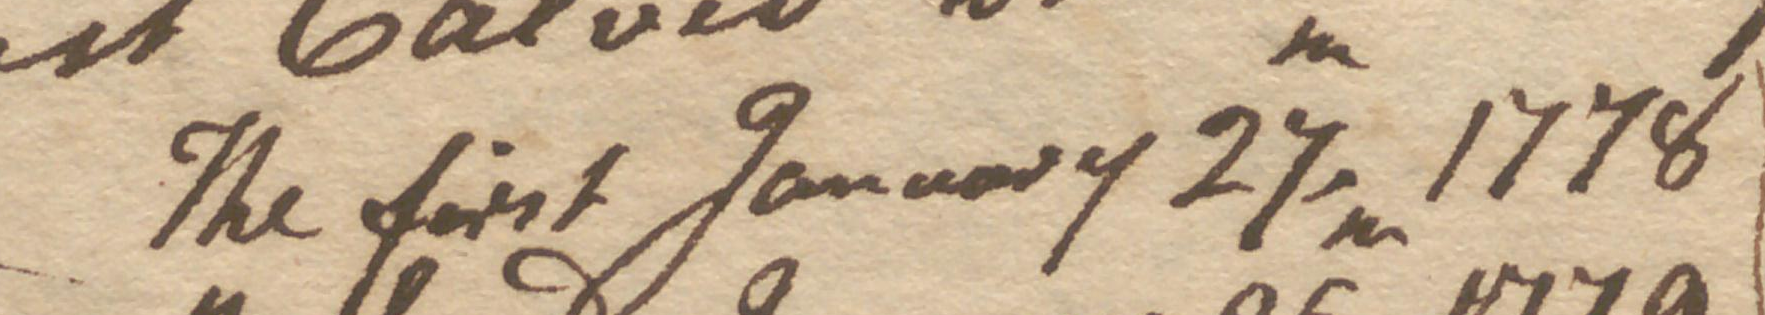The first Janursy 27^th. 1778
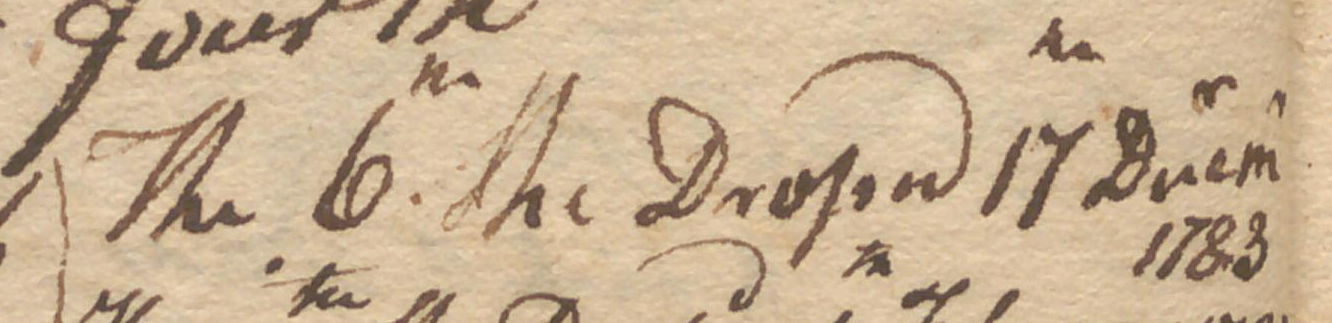the 6^th. she Droped 17^th Decem^r
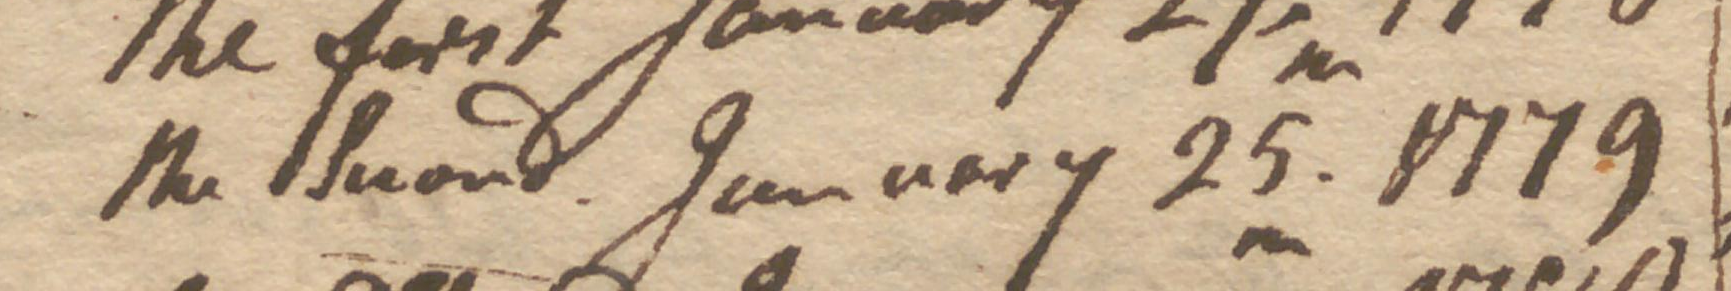the second. Junuary 25^th. 1779
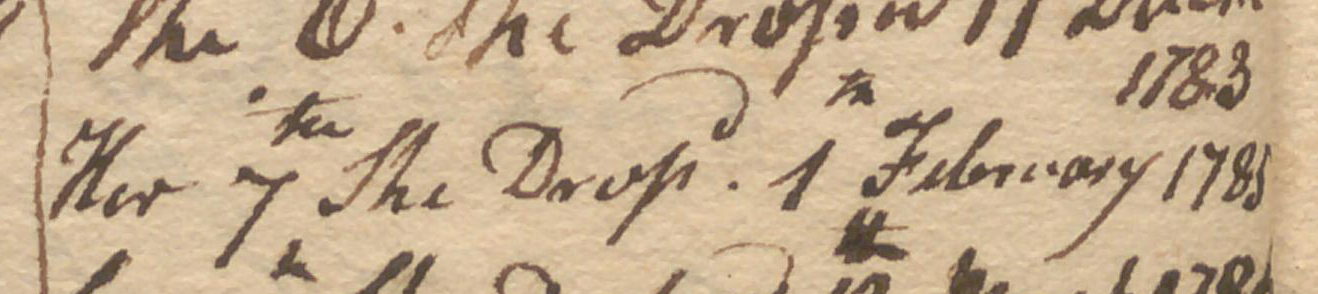Her 7^th she Drop^d. 1^th February 1785
